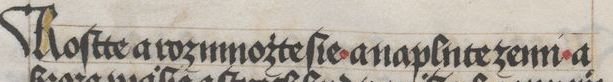Roſtte a rozmnożte ſie. a naplnte zemi.a
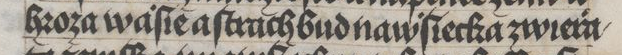hroza waẛie a ſtrach bud nawẛiecka zwieṙa¬
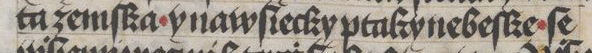ta zemſka.y nawſiecky ptaky nebeſke.ſe
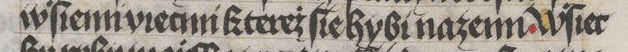wẛiemi viecmi ktereż ſie hybi nazemi.Wſiec¬
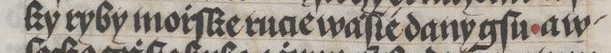ky ryby moṙſke rucie waẛie dany gſu.a w¬
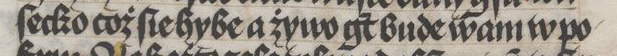ſecko coż ſie hybe a żywo ḡt bude wam w po¬
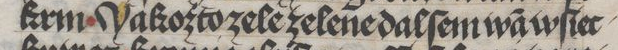krm.Yakożto zele zelene dal ſem wā wſiec¬
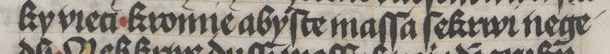ky vieci.kromie abyẛte maſſa ſekrwi nege¬
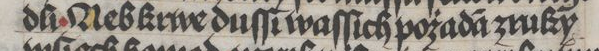dli.Neb krwe duſſi waſſich pożadā zruky
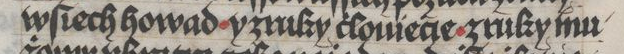wſiech howad.y zruky ċlouiecie.zruky mu¬
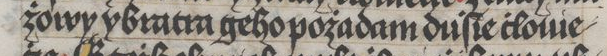żowy ybratra geho pożadam duẛie ċlouie¬
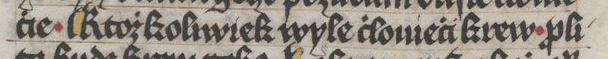ċie.Ktoż koliwiek wyle ċlouieċí krew.ꝓli¬
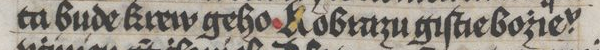ta bude krew geho.K obrazu giſtie bożiev
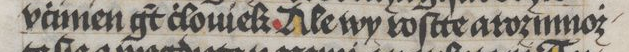vċinien ḡt ċlouiek.Ale wy roſtte a rozmnoż¬
